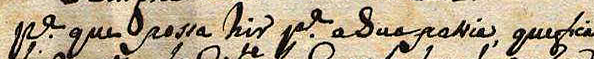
p.a que possa hir p.a a Sua patria, que fica
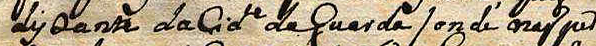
distante da Cid̄e da Guarda /onde naõ per
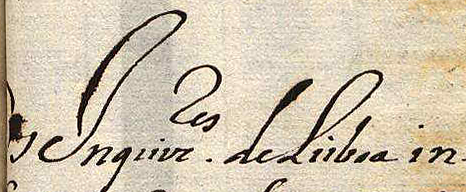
s Inquiz.Res de Lisboa in.
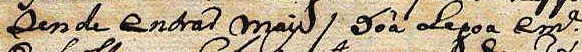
tende entrar mais/ boá Legoa e m;e
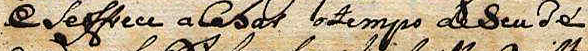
E se offrece aCabar o tempo de seu de
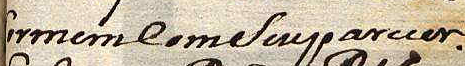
rmem com Seu parecer
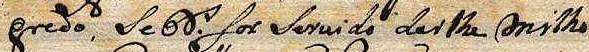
gredo, Se D.s for Seruido darlhe milho
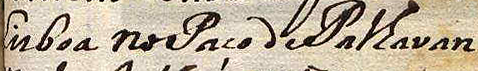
Lisboa no Paço de Palhavan
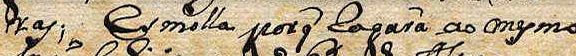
ras; Esmolla porq̄ Rogará ao mesmo
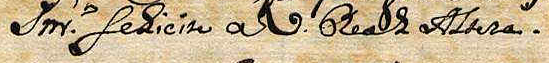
Snr̄. seLicite a V. Real Alteza.
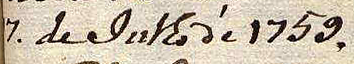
7. de Iulho de 1759.
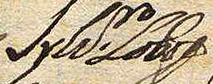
Sylv.ro Lobo
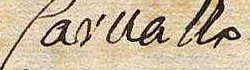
Carualho
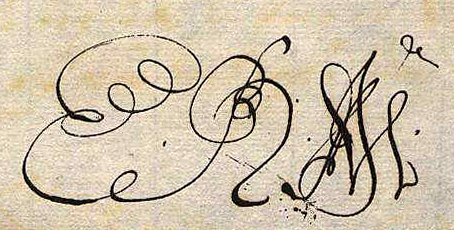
E.R.M.ce
